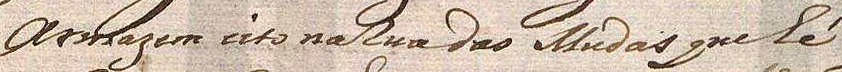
armazem cito na Rua das Mudas que hé
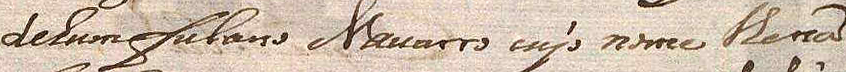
de hum fulano Nauarro cujo nome lhe naõ
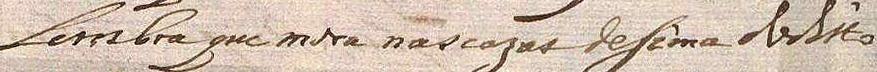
Lembra que mora nas cazas de sima do ditto
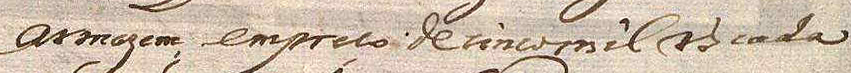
armazem, em preço de cinco mil rs̄ cada
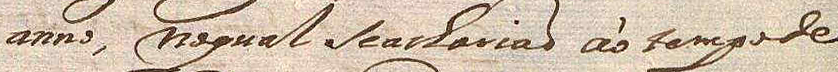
anno, no qual se acharia ao tempo de
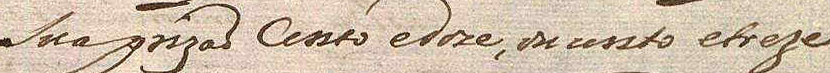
sua prizaõ cento e doze, ou cento e treze
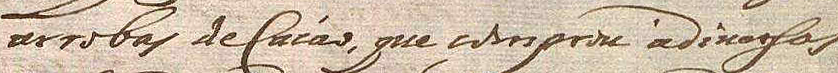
arrobas de Cacáo, que comprou a diuersas
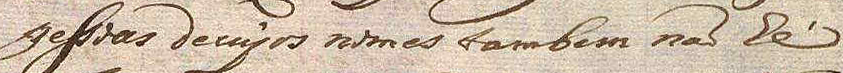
pessoas de cujos nomes tambem naõ hé
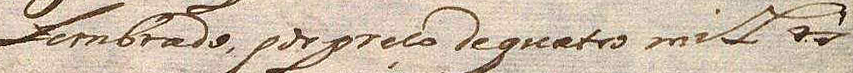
Lembrado, por preço de quatro miL rs̄
